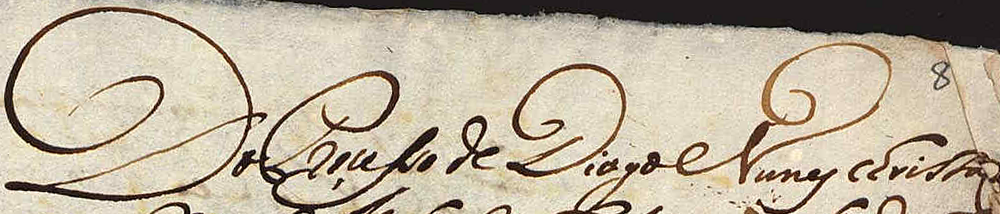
Do Processo de Diogo Nunes christão
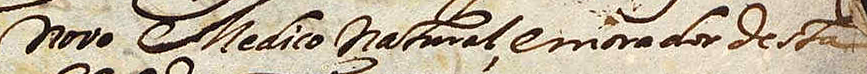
novo Medico natural, e morador desta
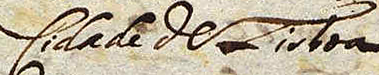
Cidade de Lisboa
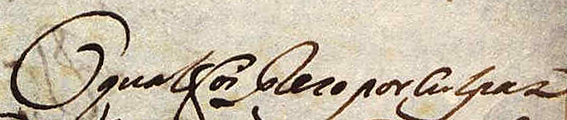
O qual foi pRezo por culpas
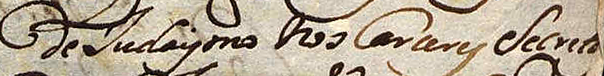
de Iudaismo nos Carceres Secreto
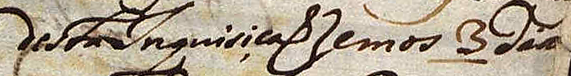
desta Inquisiçaõ em os 3 dia
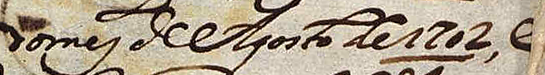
do mes de Agosto de 1702, e
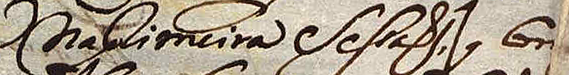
na primeira Sessaõ, q̄ Con
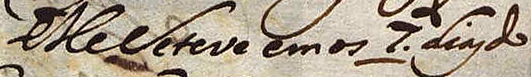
elle se teve em os 7. dias do
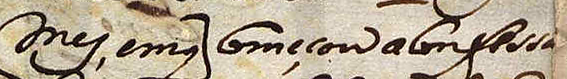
mes, em q̄ Começou a Confessa
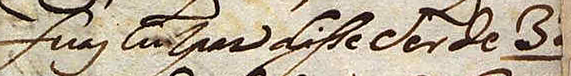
suas Culpas disse ser de 3
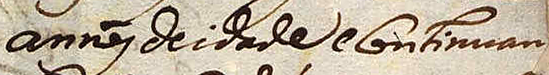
annos de idade, e Continuan
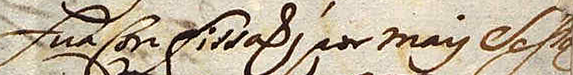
Sua Confissaõ por mais Sess
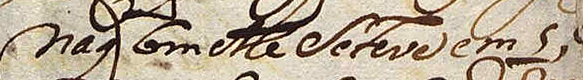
na q̄ Com elle Se teve em
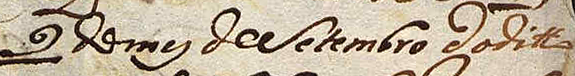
9 do mes de Setembro do ditto
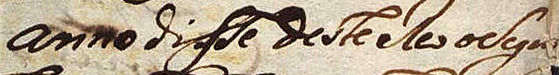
anno disse deste Reo o Segui
